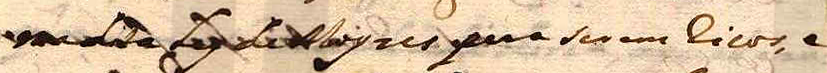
na dita Ley de Moyzes pera serem Ricos, e
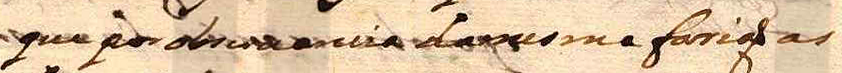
que por obseruancia da mesma fariaõ as
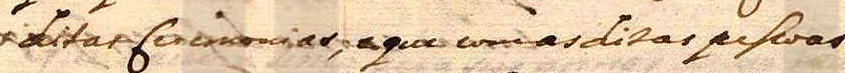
ditas Ceremonias, e que com as ditas pessoas
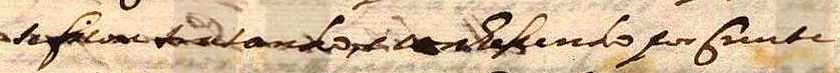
se ficou tratando, e conhessendo por Crente
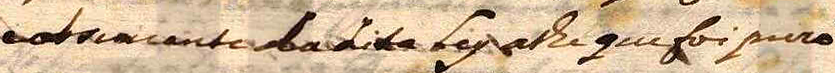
e obseruante da dita Ley athe que foi prezo
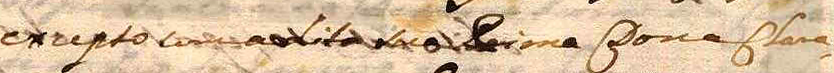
excepto com a dita sua Prima Dona Clara,
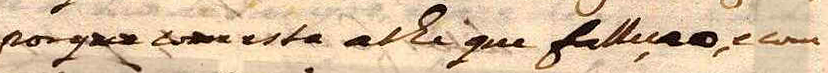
porque com esta athe que falleçeo, e com
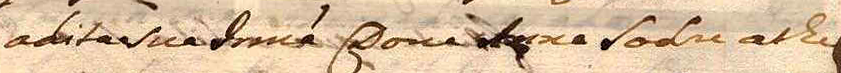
a dita sua Irmã Dona Anna Sodre athe
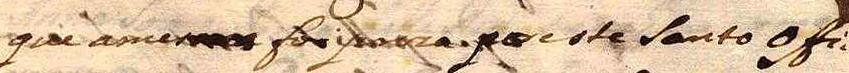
que a mesma foi preza por este Santo Offi
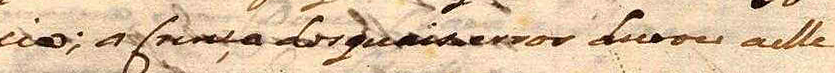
cio; a Crença dos quais erros durou a elle
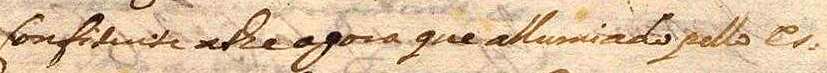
Confitente athe agora que allumiado pello es
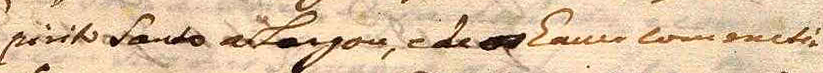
pirito Santo a Largou, e de os hauer commeti
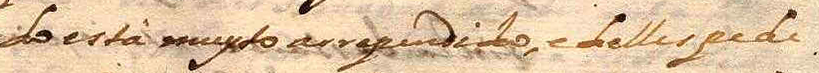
do está muyto arrependido, e delles pede
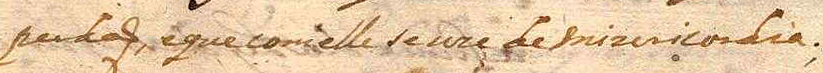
perdaõ, e que com elle se uze de mizericordia;
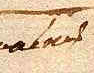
e al naõ
